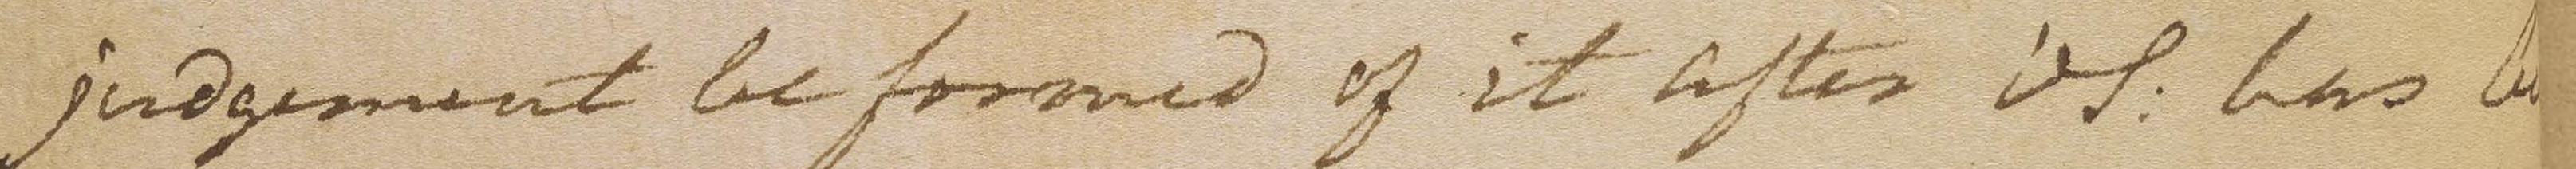judgement be formed of it after US: has been
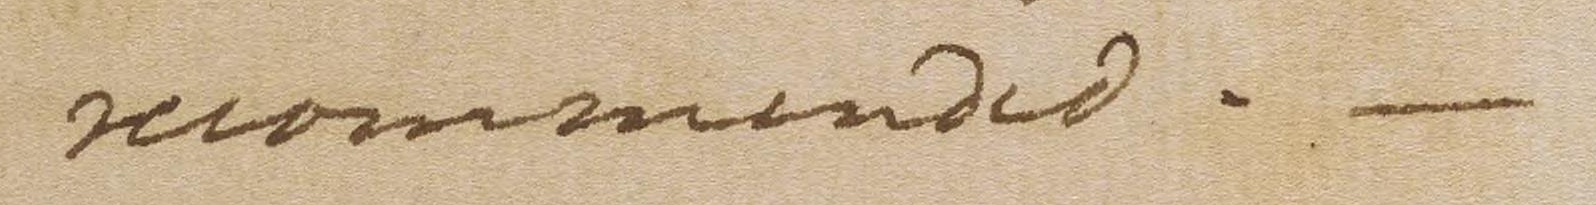recommended.-
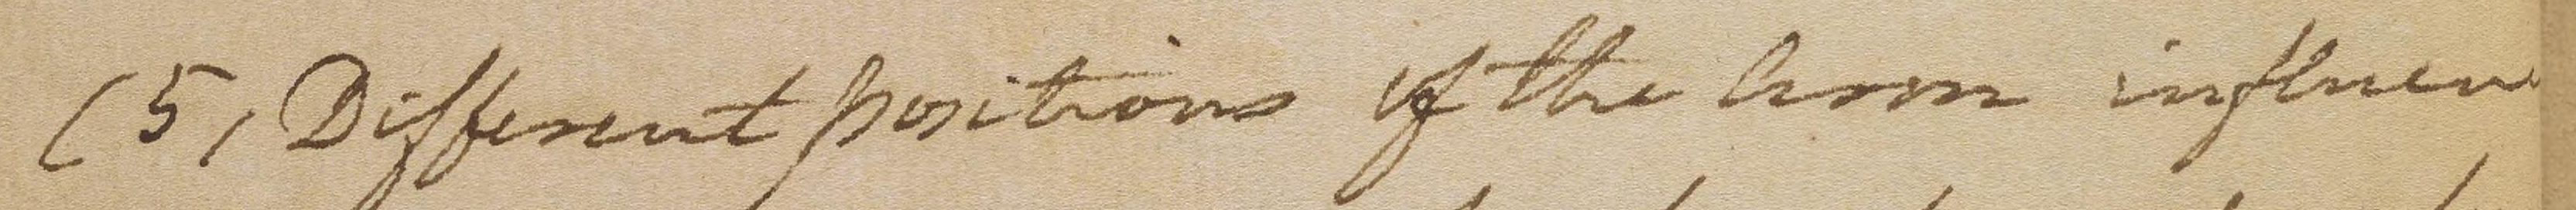(5) Different positions of the arm influence
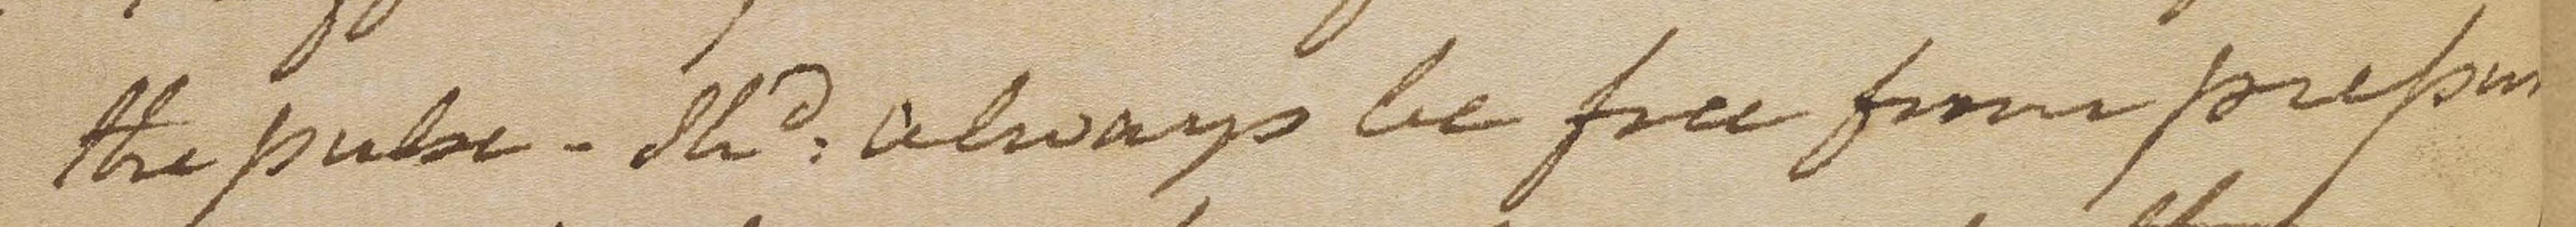the pulse, Sh^d always be free from prep[__]
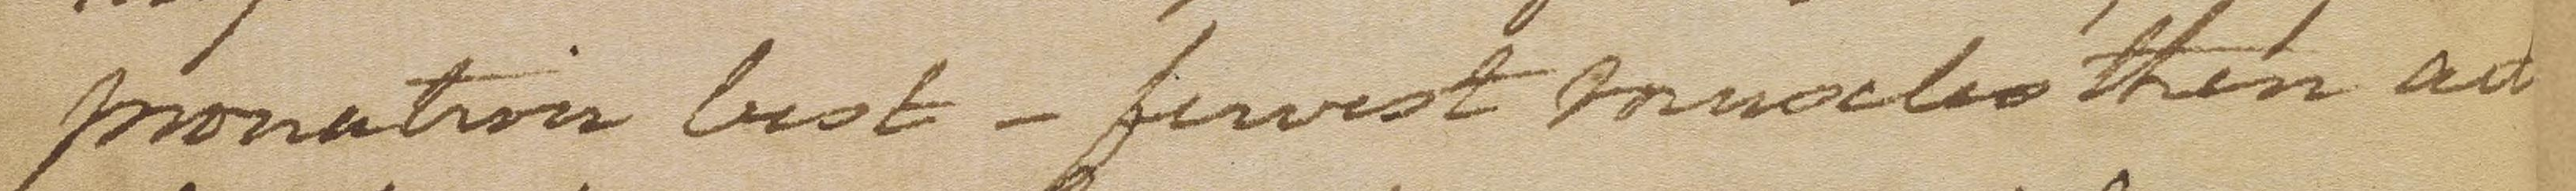pronation best, fewest muscles then act
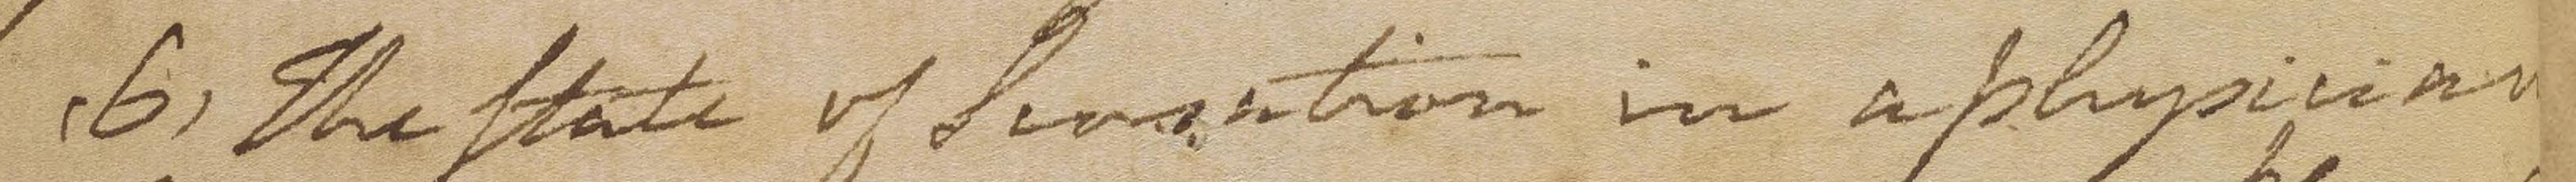(6) The State of Sensation in a physicain
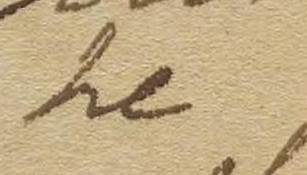he
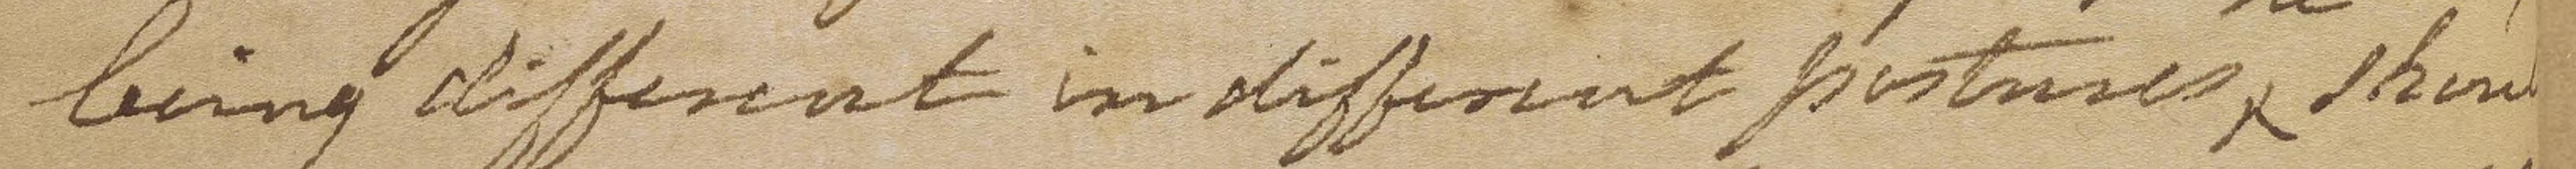being different in different postures ^ should
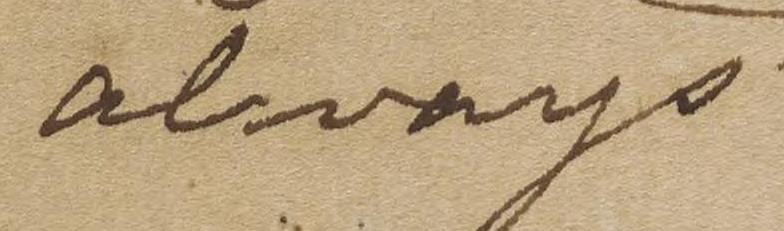always
